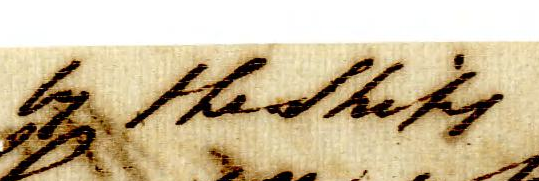by the ships
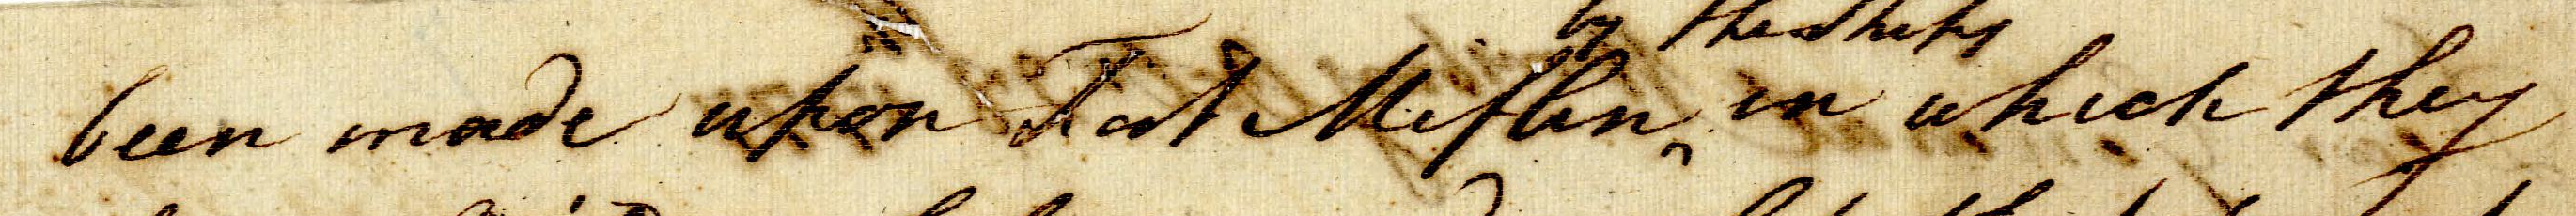been made upon Fort Miflin ^ in which they
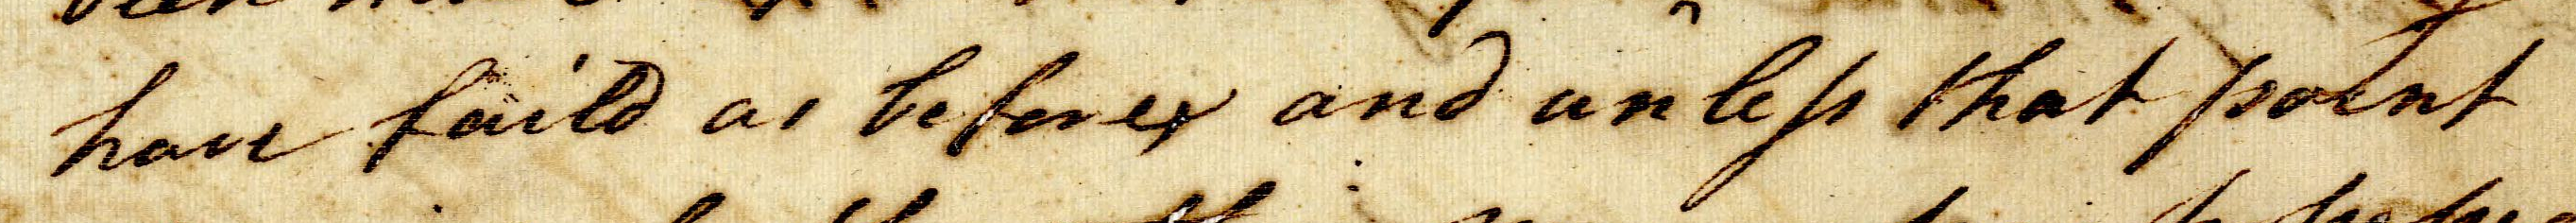have fail'd as before, and unless that point
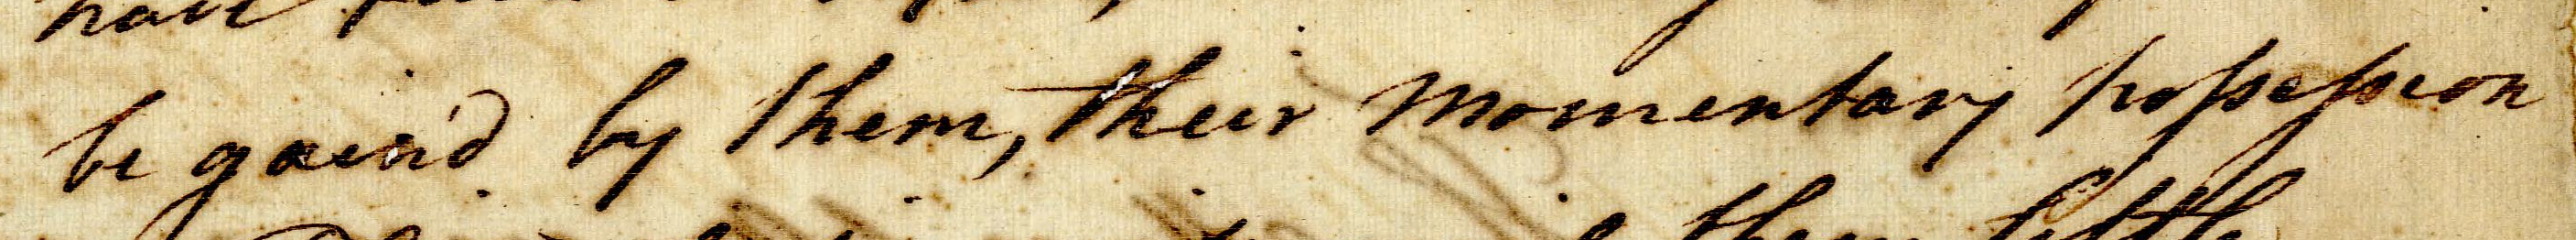be gain'd by them, their momentary possession
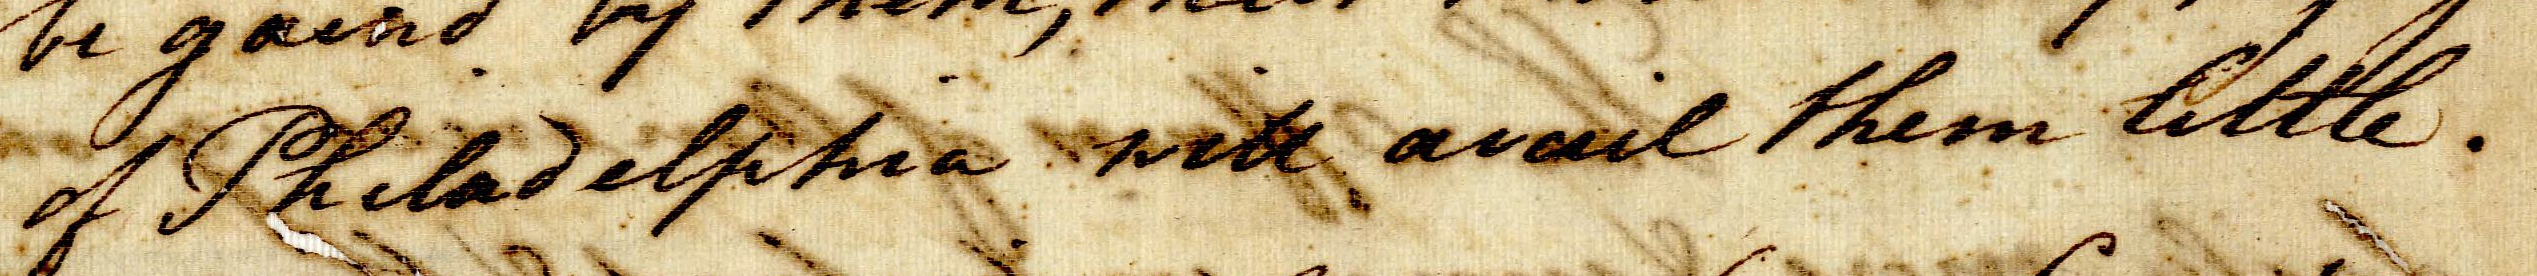of Philadelphia will avail them little.
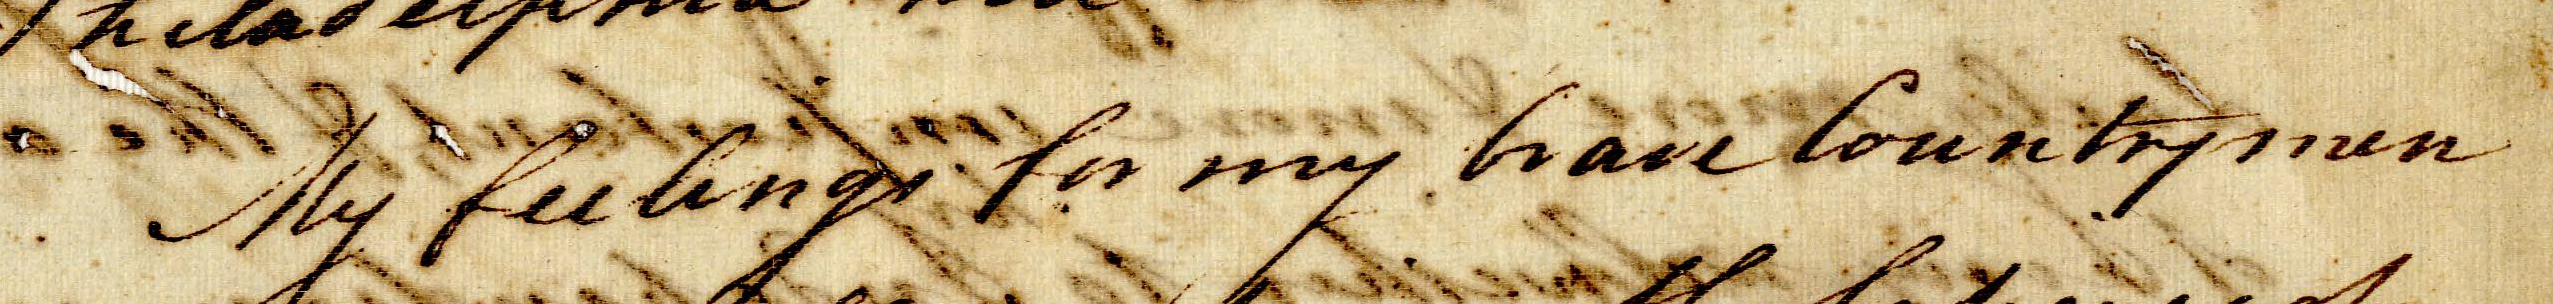My feelings for my brave Countrymen
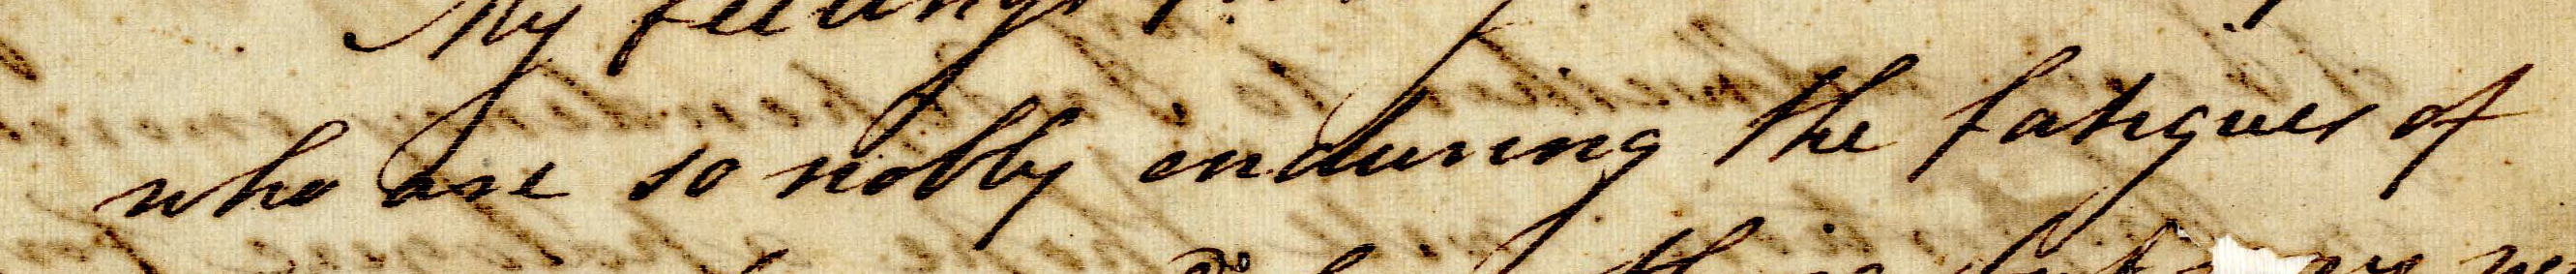who are so nobly enduring the fatigues of
